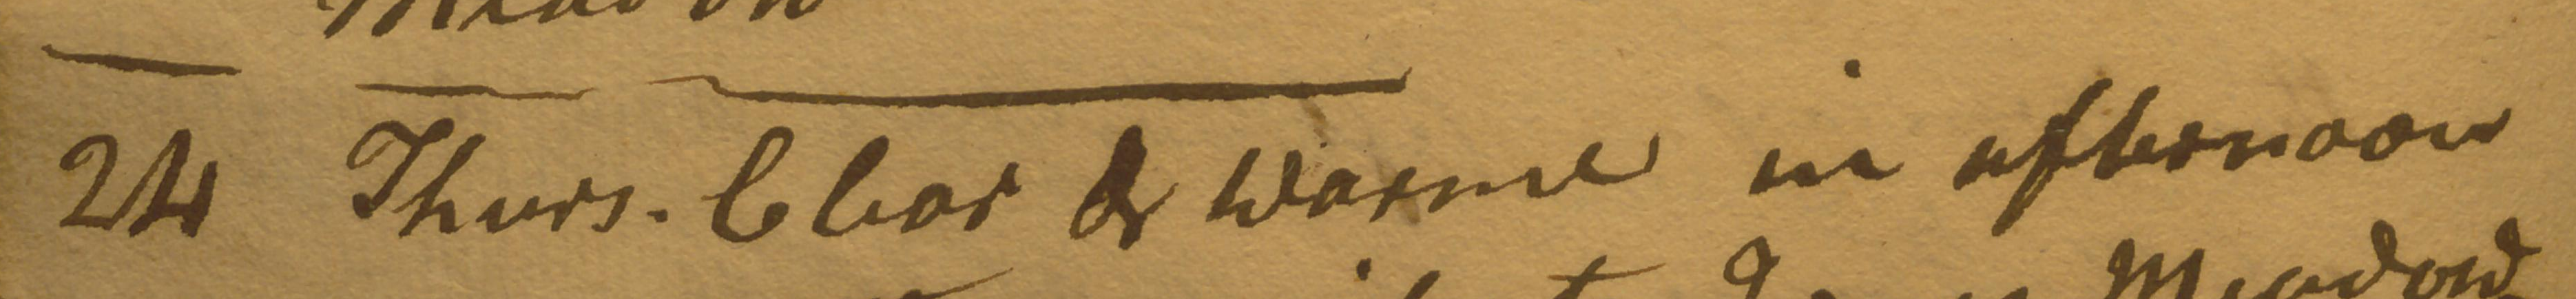24 Thurs. Clear & warme in afternoon
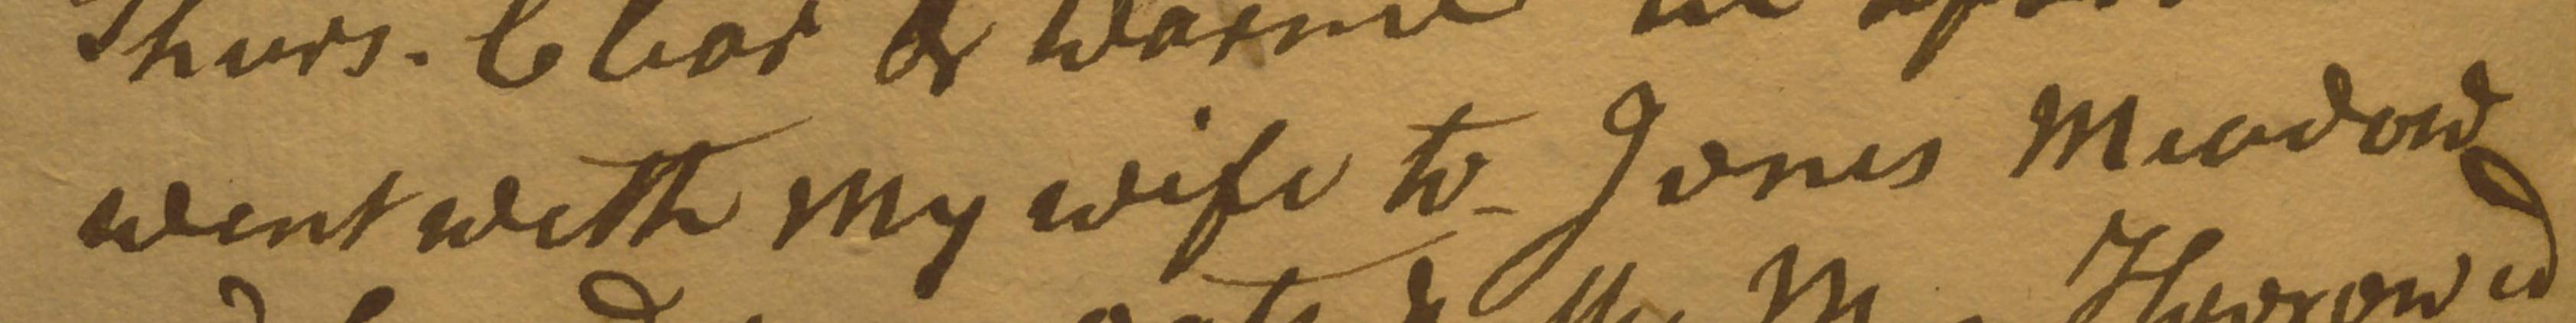went with my wife to Jones Meadow
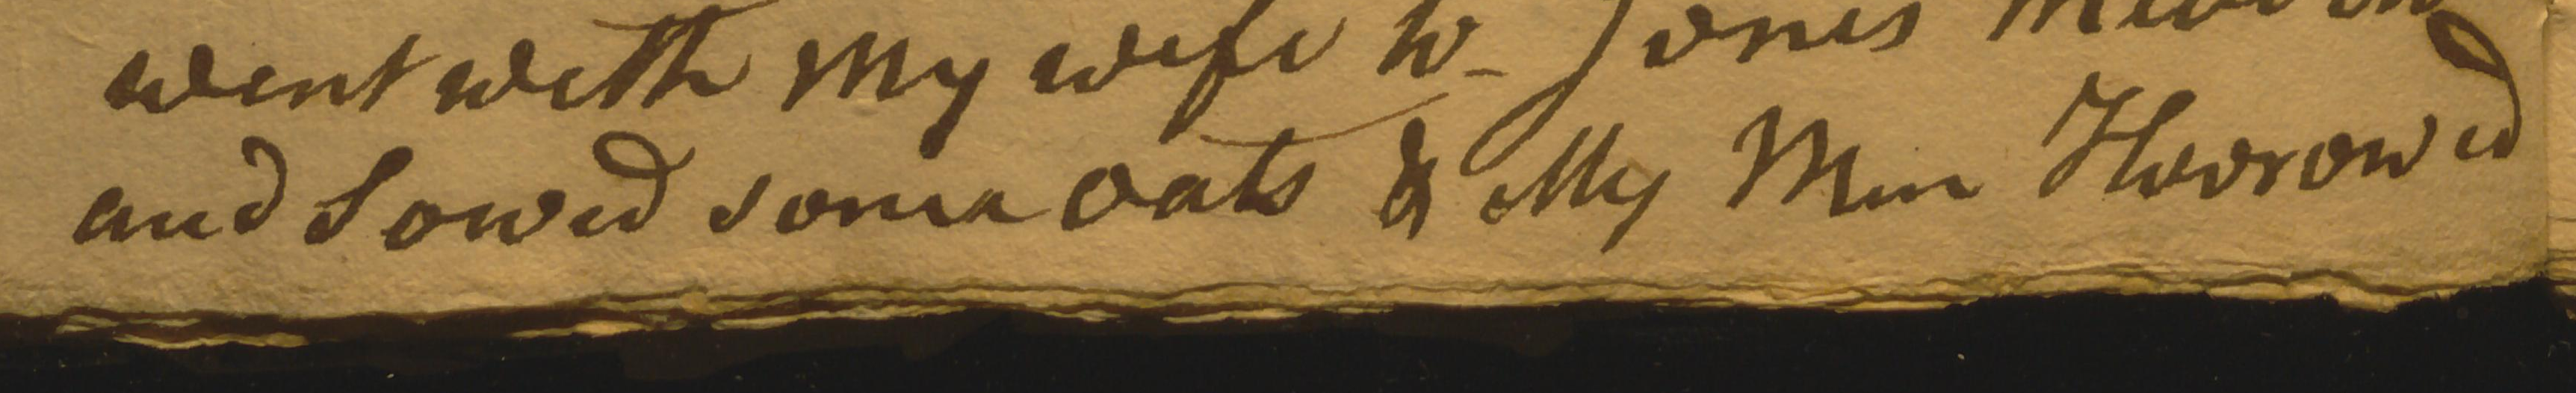and sowed some oats & My Men Harrowed
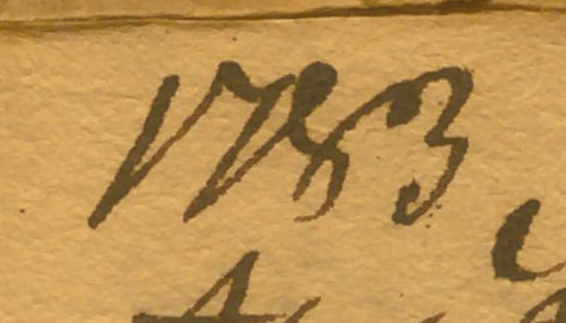1783
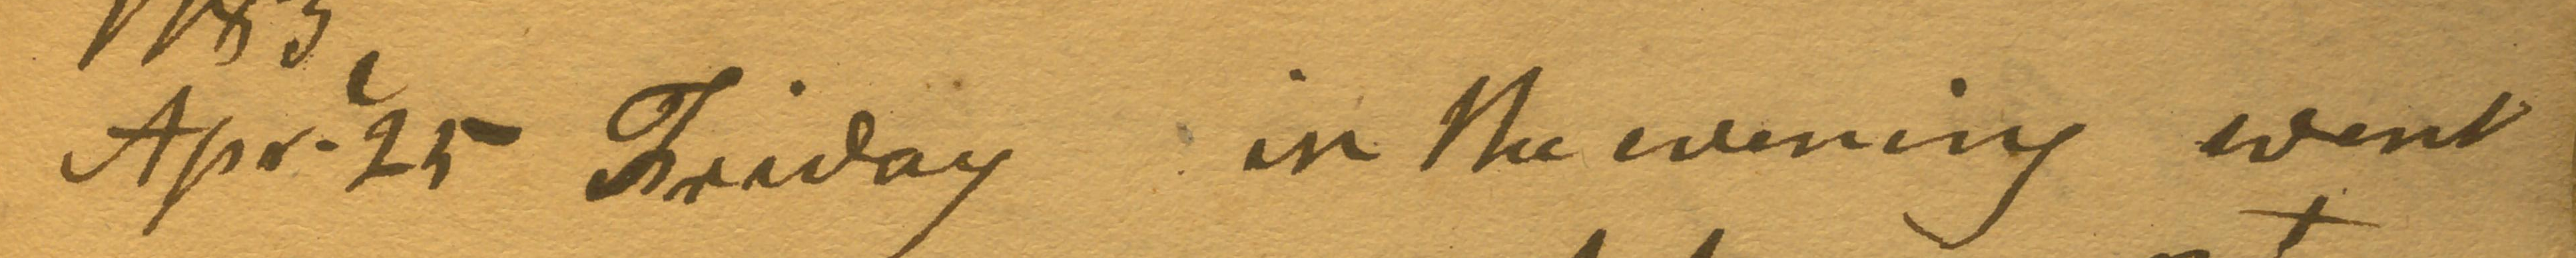Apr^l. 25 Friday, in the evening went
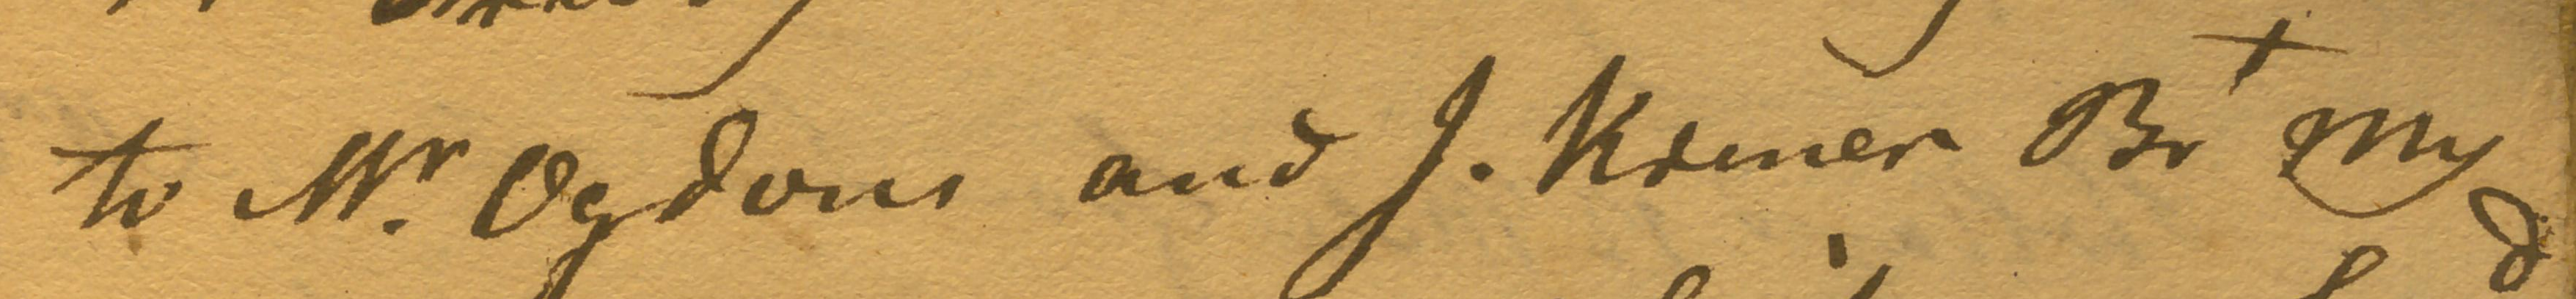to M^r. Ogdons and J. Krener Br^t my
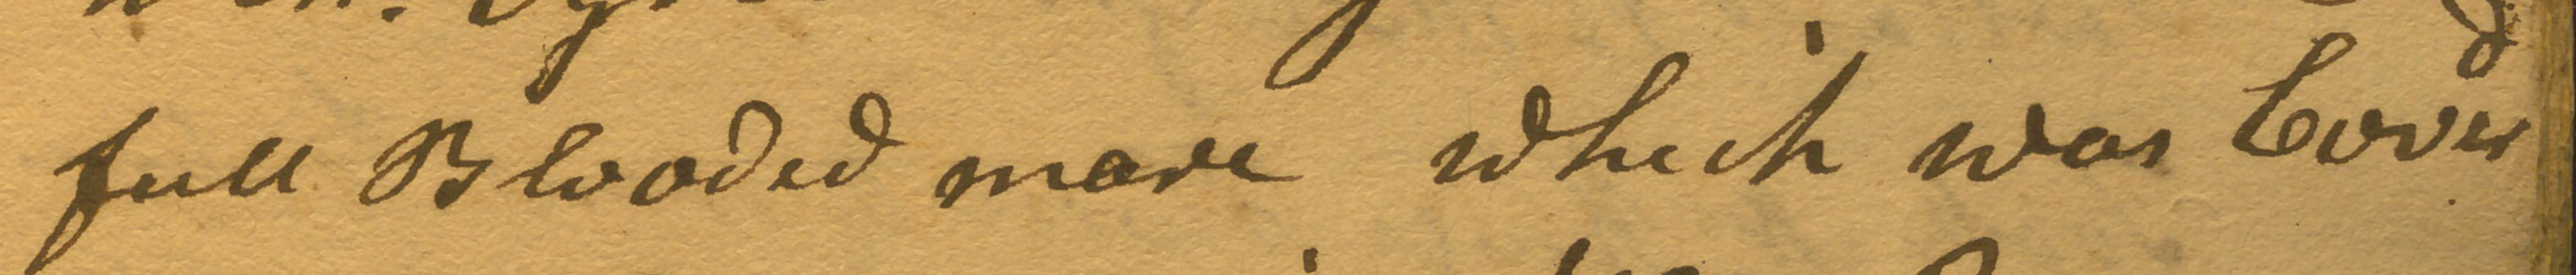full Blooded mare which was Cover^d
